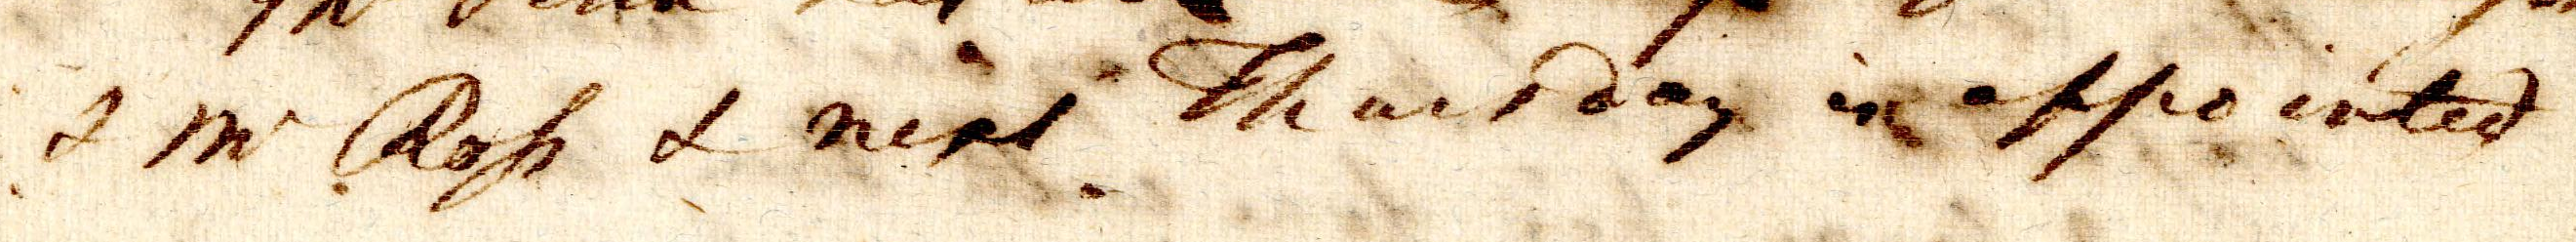& M^r Ross & next Thursday is appointed
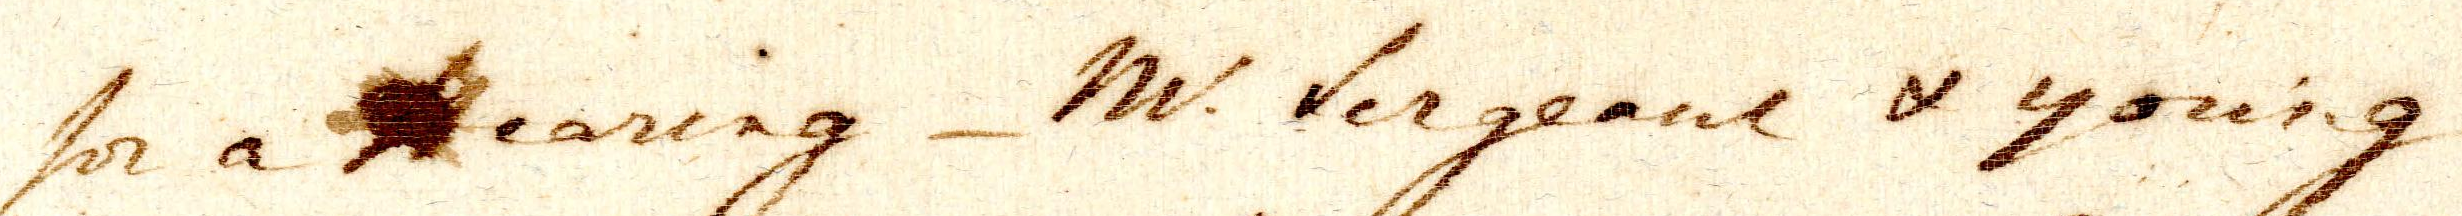for a Hearing. M^r Sergeant & young
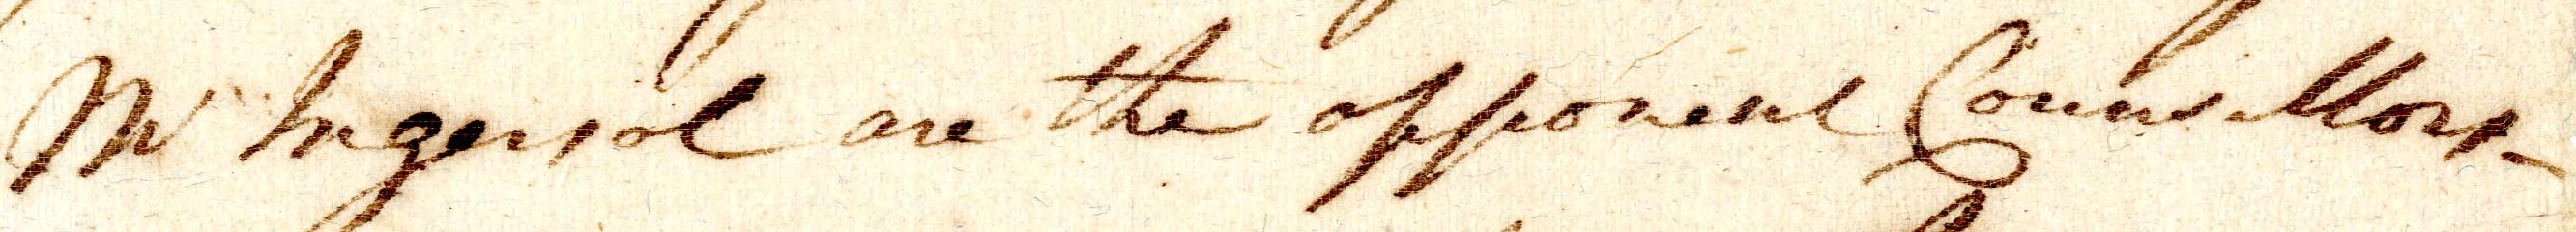M^r Ingersol are the opponent Counsellors,
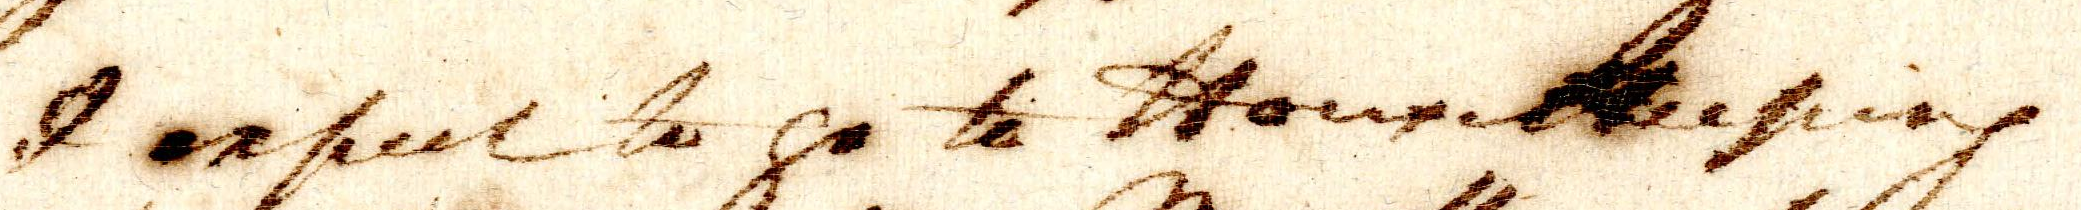I expect to go to House Keeping
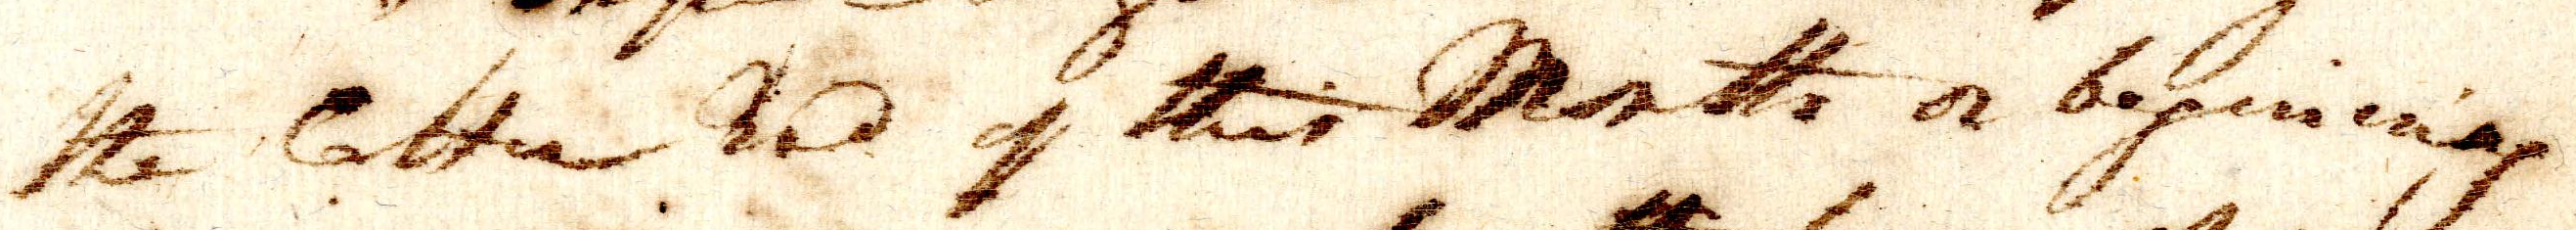the Catfar had of this Months or beginning
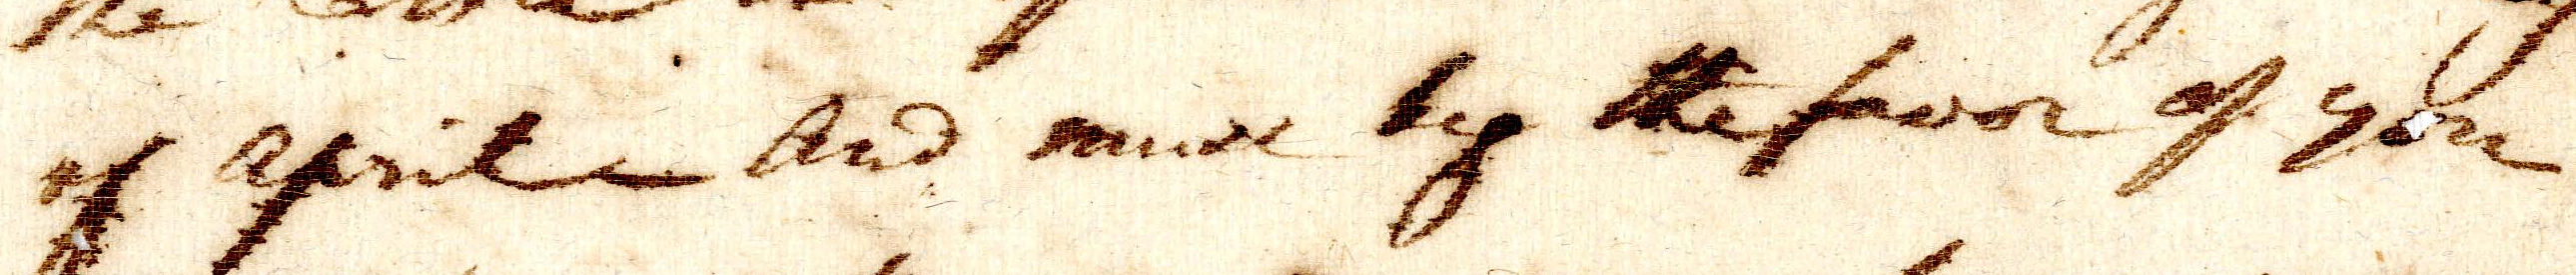of April and must beg the favor of you
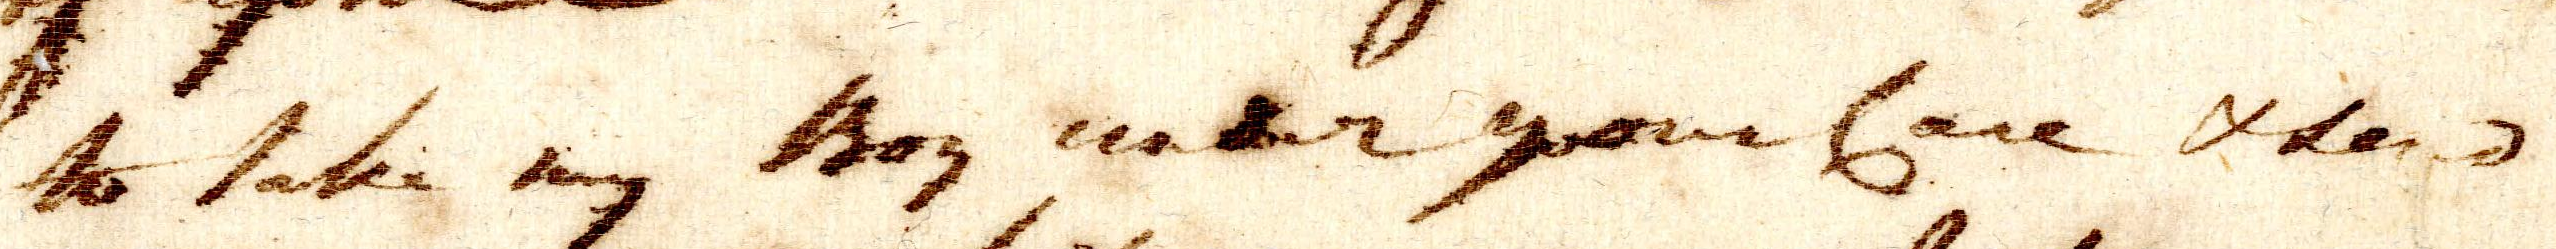to take my Boy under your Care & send
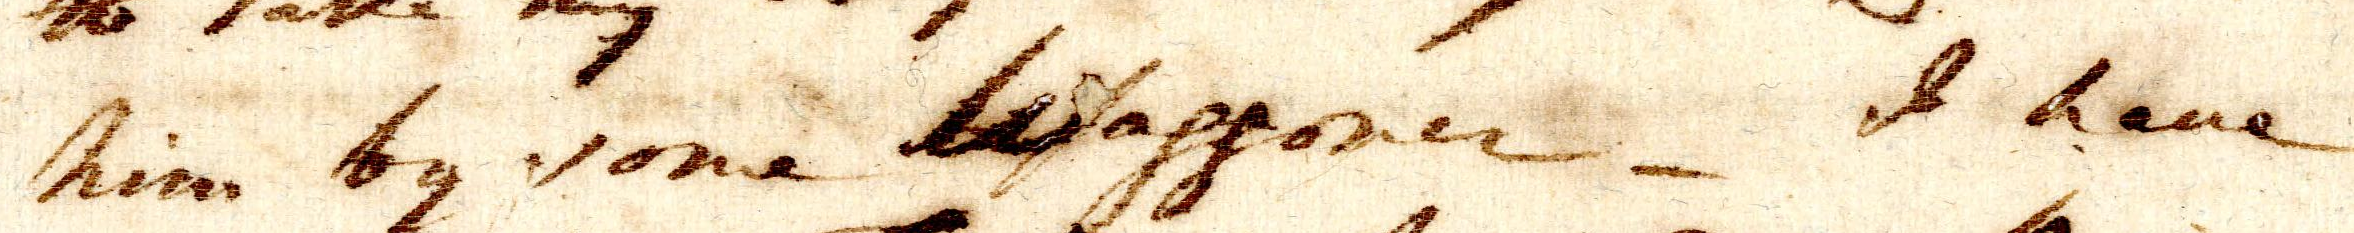him by some Waggoner. I have
